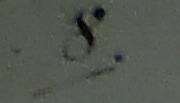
8.
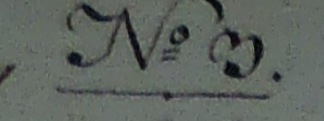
No͇ 3.
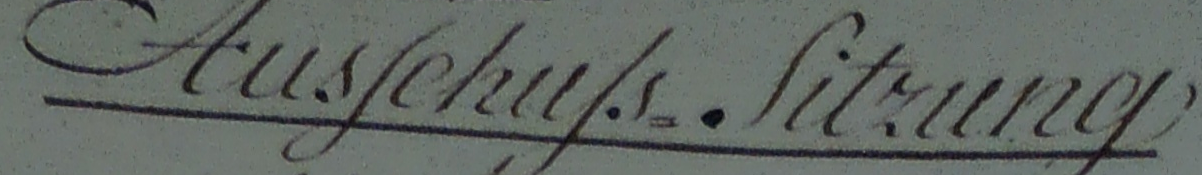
Ausschuss‗Sitzung
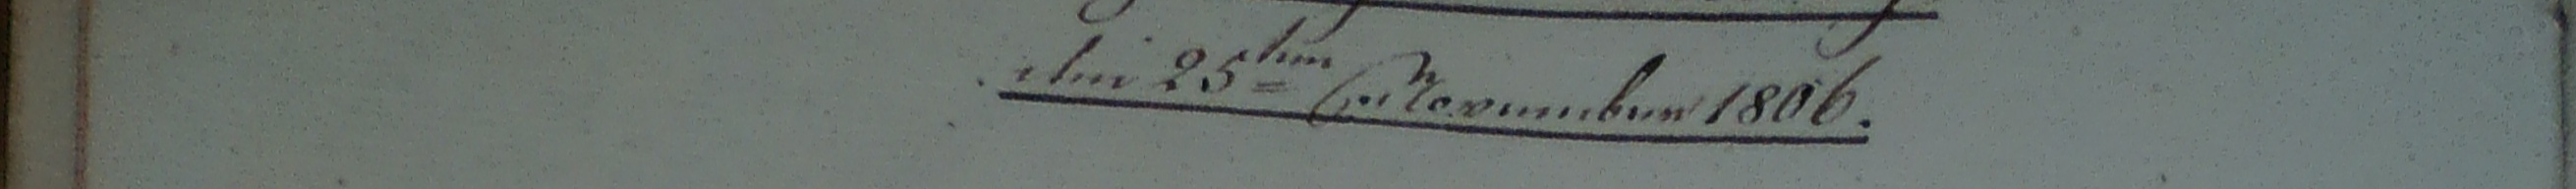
den 25te͇n November 1806.
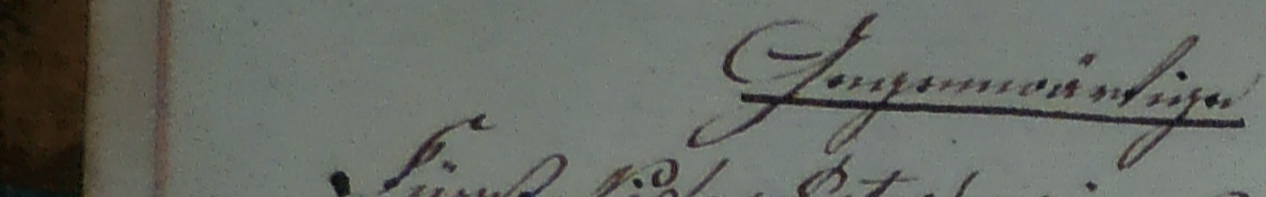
Gegenwärtige
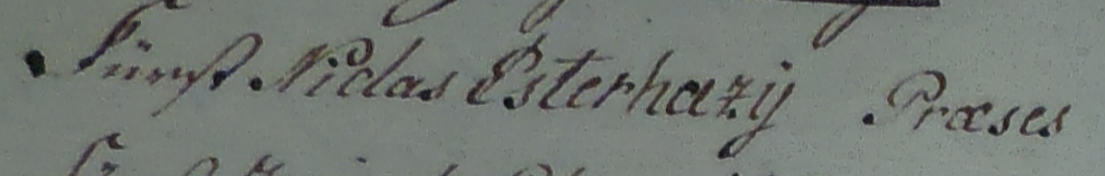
Fürst Niclas Esterhazy Præses
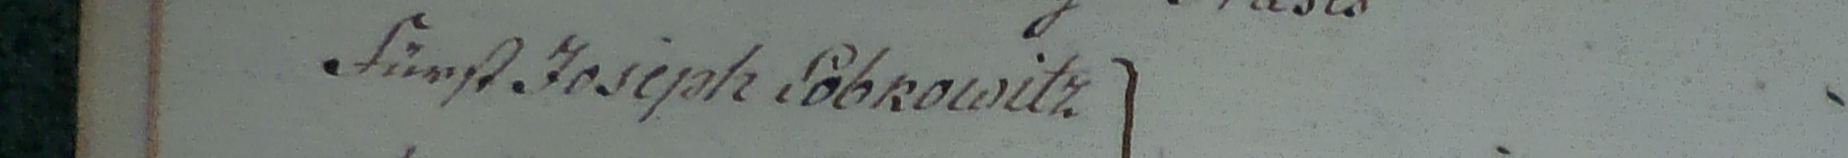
Fürst Joseph Lobkowitz
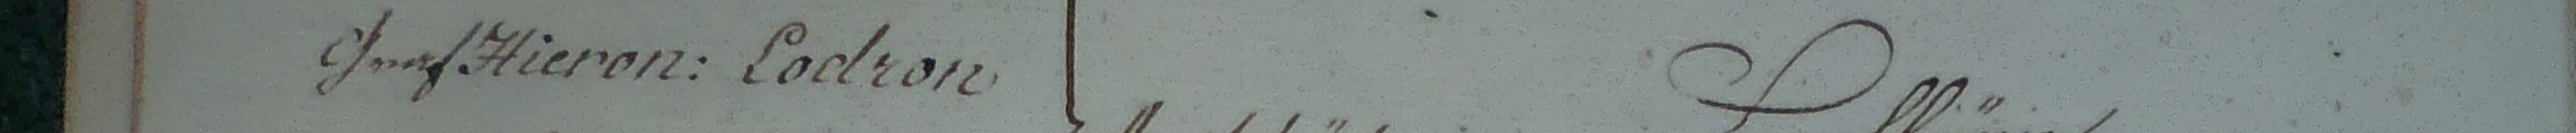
Graf Hieron: Lodron
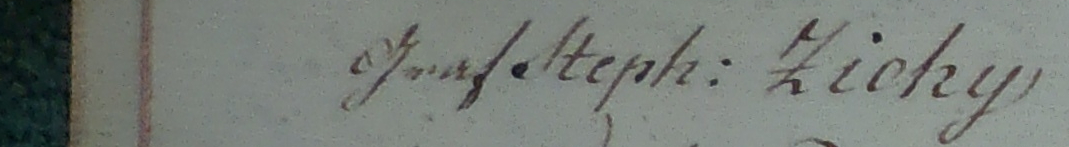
Graf Steph: Zichy
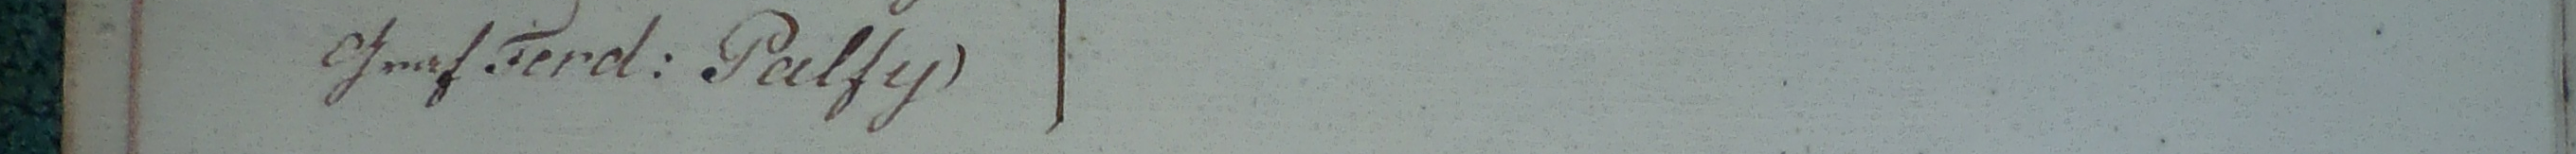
Graf Ferd: Palfy
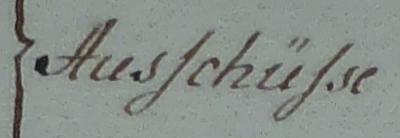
Ausschüsse
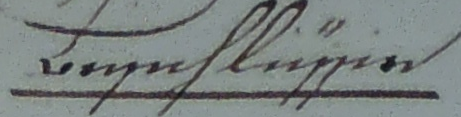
Beschlüsse
